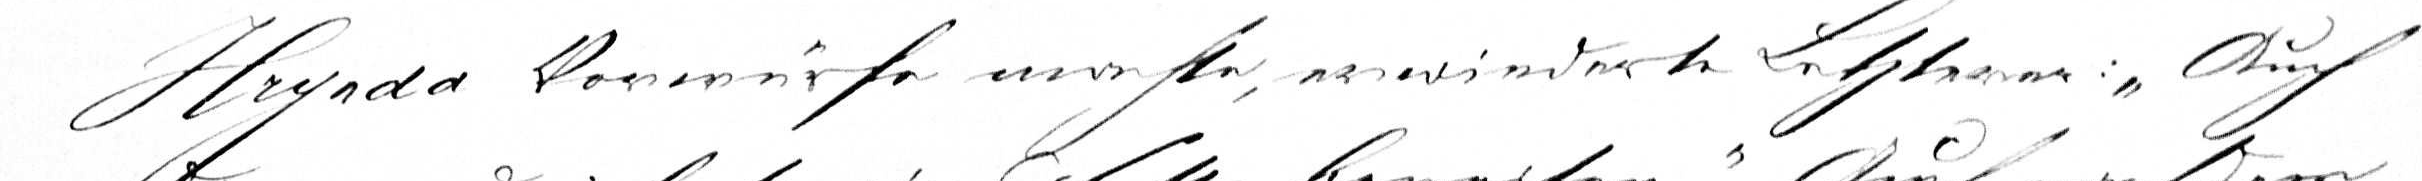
Hrynda Vorwürfe machte, erwiederte Letzterer: „Auch
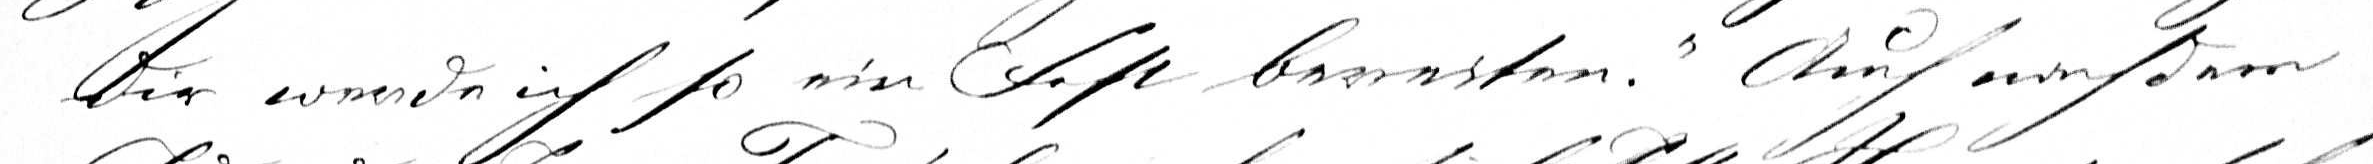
die werde ich so ein Fest bereiten." Auch nach dem
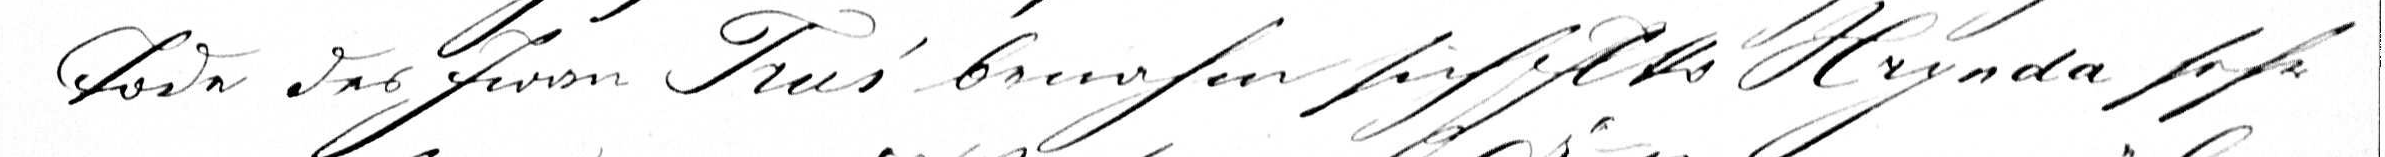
Tode des Jwan Tru's benahm sich Jlko Hrynda sehr
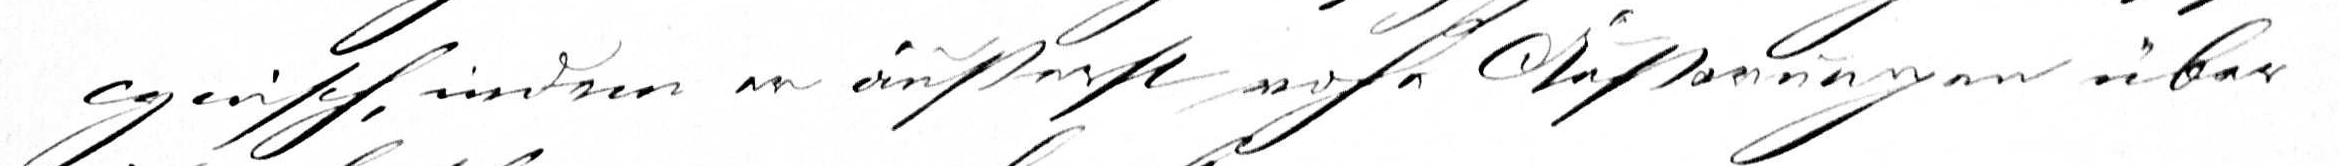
xx, in dem xx äußerst rohe Äußerungen über
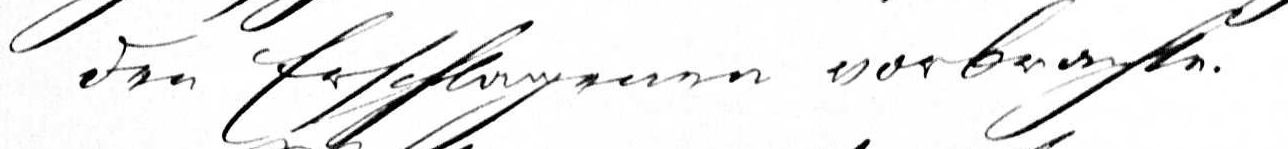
den Erschlagenen vorbrachte.
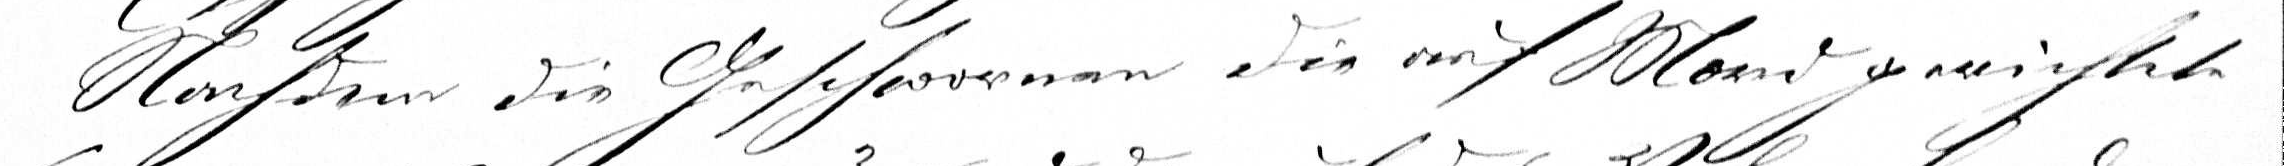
Nachdem die Geschwornen die auf Mord gerichtet
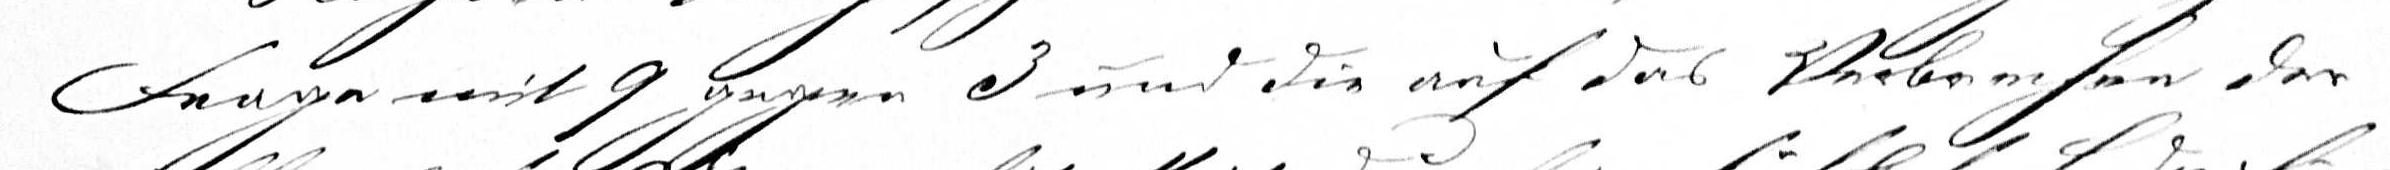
Frage mit 9 gegen 3 und die auf das Verbrechen der
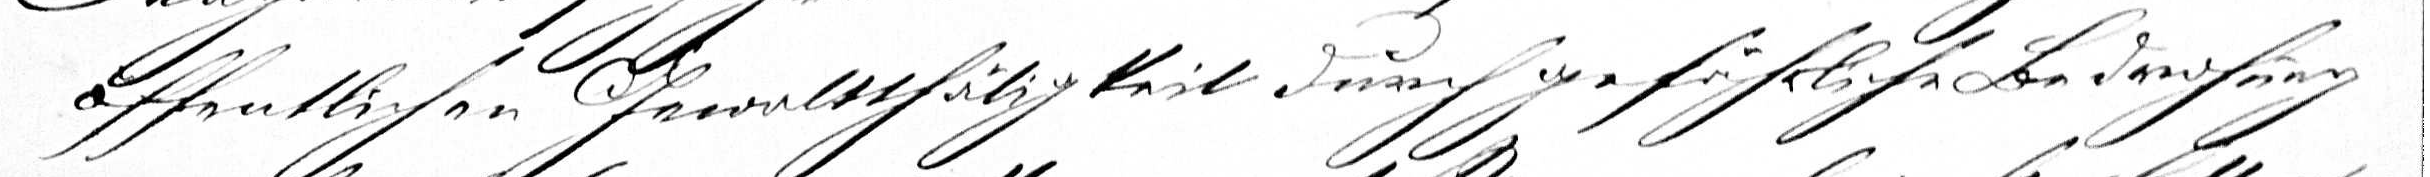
öffentlichen Gewaltthätigkeit durch gefährliche Bedrohung
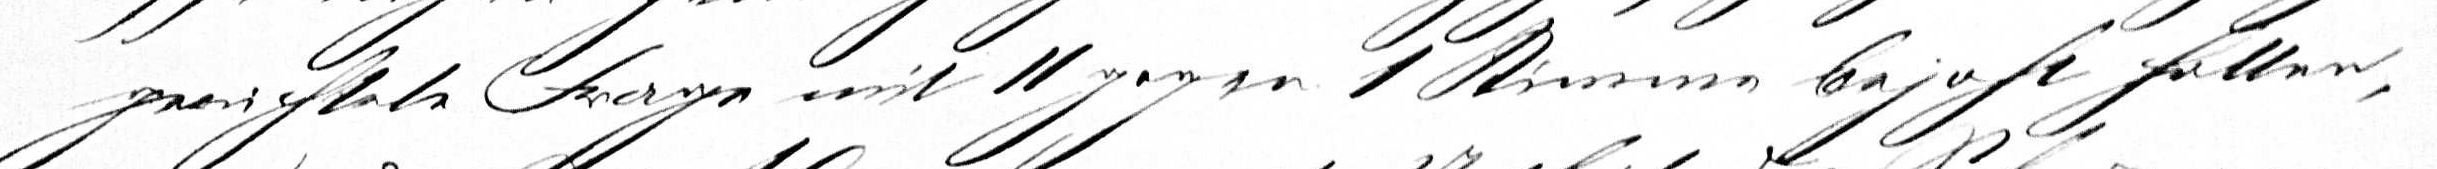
gerichtete Frage mit 11 gegen 1 Stimme bejaht hatten,
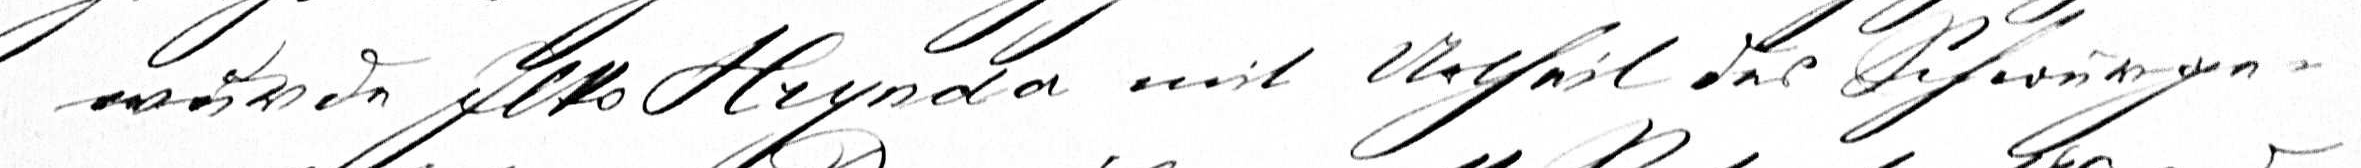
wurde Jlko Hrynda mit Urtheil des Schwurge¬
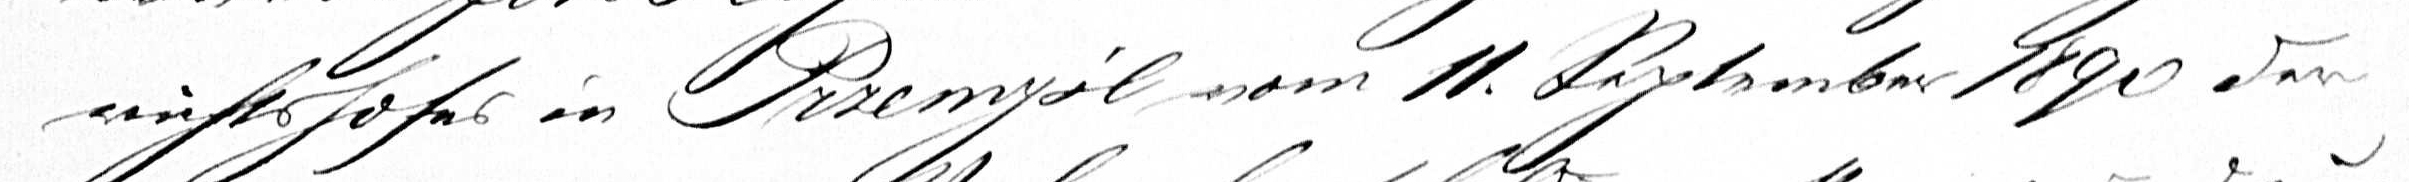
richteshofes i Przemys'l vom 11. September 1890 der
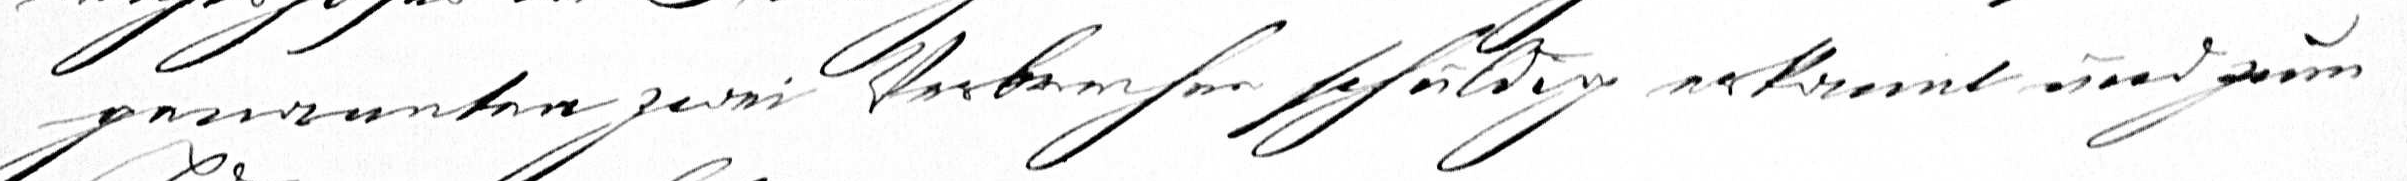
genannten zwei Verbrechen schuldig erkannt und zum
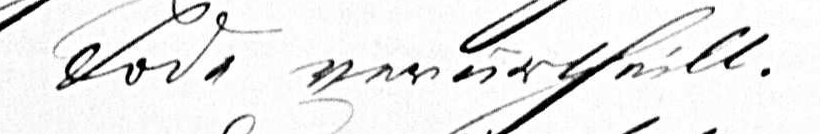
Tode verurtheilt.
